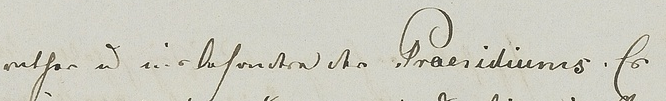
rathes und insbesondre des Praesidiums. Es
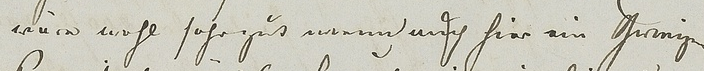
wäre wohl sehr gut wenn auch hier ein Schweizer
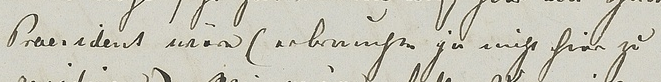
Praesident wäre (er brauchte ja nicht hier zu
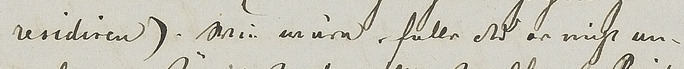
residiren). Wie wäre, falls du es nicht an-
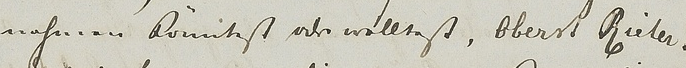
nehmen könntest oder wolltest, Oberst Rieter ?
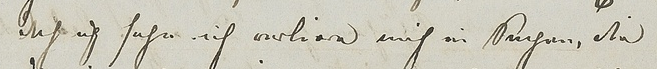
Doch ich sehe ich verliere mich in Sachen, die
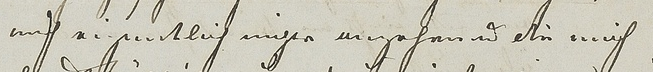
mich eigentlich nichts angehen und die mich
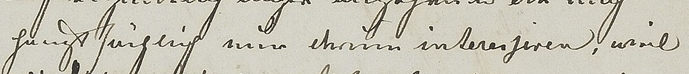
hauptsächlich nur darum interessiren, weil
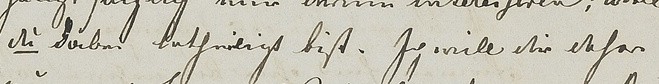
du dabei betheiligt bist. Ich will dir daher
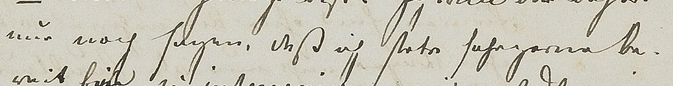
nur noch sagen, daß ich stets sehr gerne be-
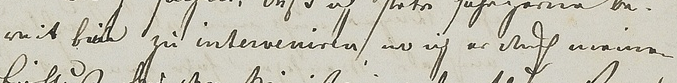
reit bin zu interveniren, wo ich es durch meinen
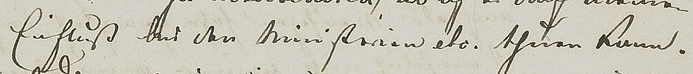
Einfluß bei den Ministerien etc. thun kann.
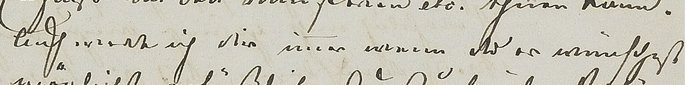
Auch werde ich dir immer wenn du es wünschest
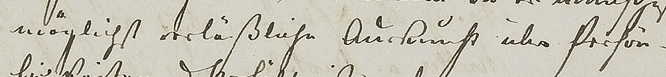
möglichst verläßliche Auskunft über Persön-
